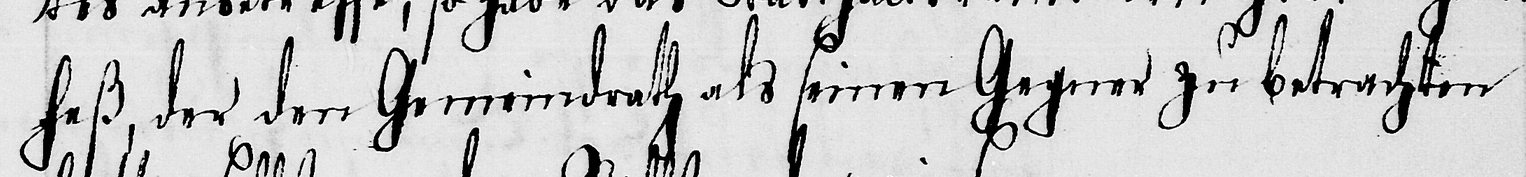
heß, der den Gemeindrath als seinen Gegner zu betrachten
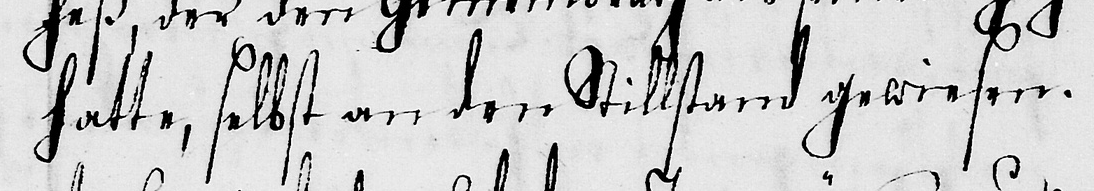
hatte, selbst an den Stillstand gewiesen.
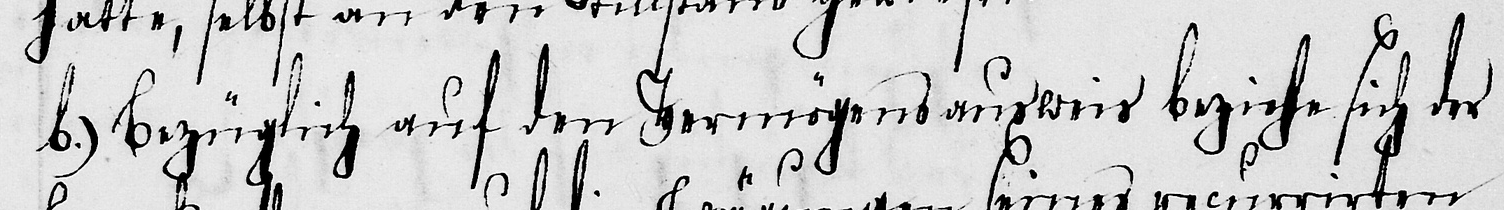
b.) Bezüglich auf den Vermögensausweis beziehe sich der
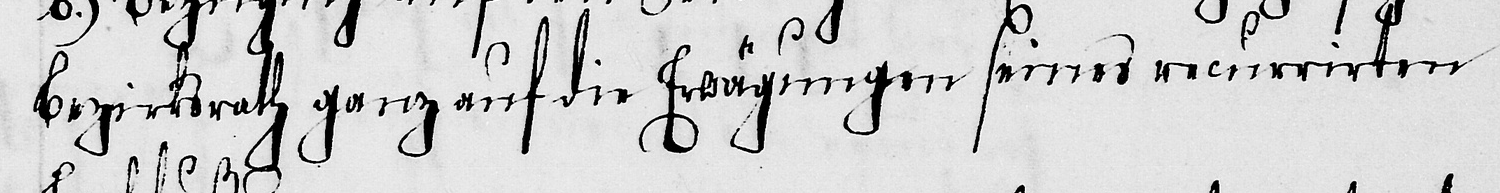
Bezirksrath ganz auf die Erwägungen seines recurrirten
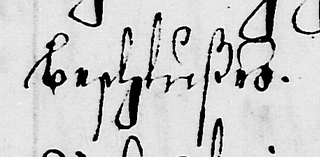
Beschlußes.
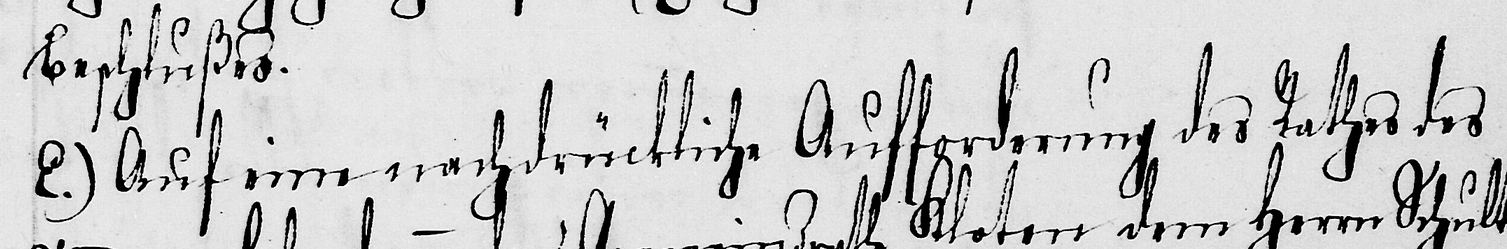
E.) Auf eine nachdrückliche Aufforderung des Rathes des
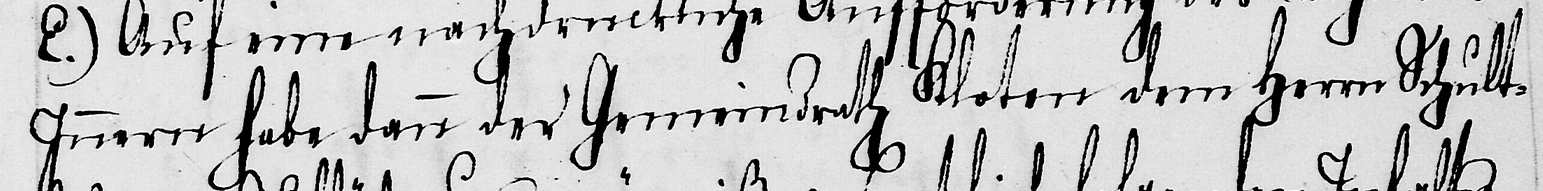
Innern habe dann der Gemeindrath Kloten dem Herrn Schult¬
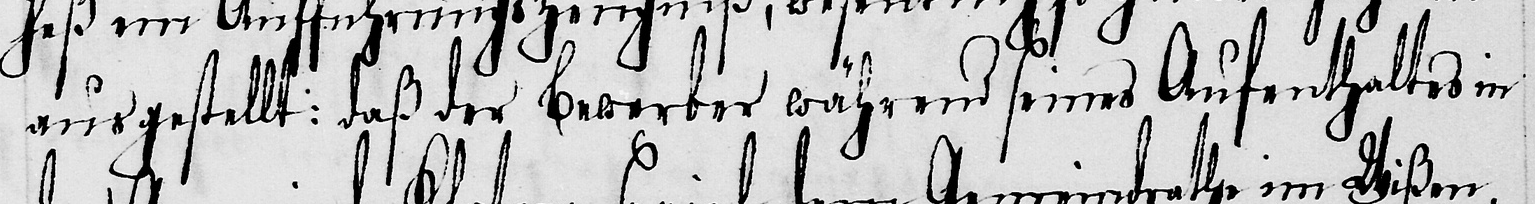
ausgestellt: daß der Bewerber während seines Aufenthaltes in
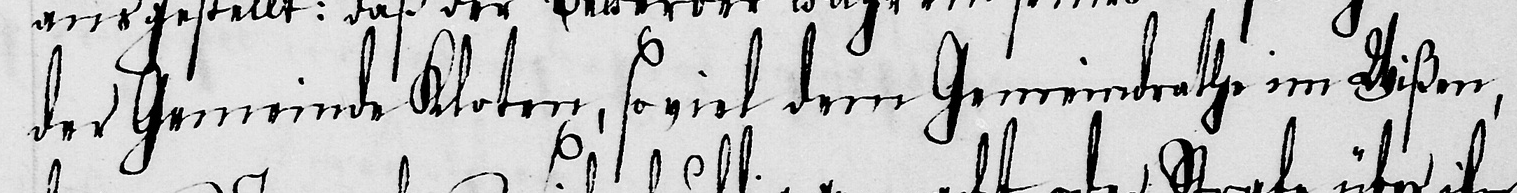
der Gemeinde Kloten, so viel dem Gemeindrathe im Wißen,
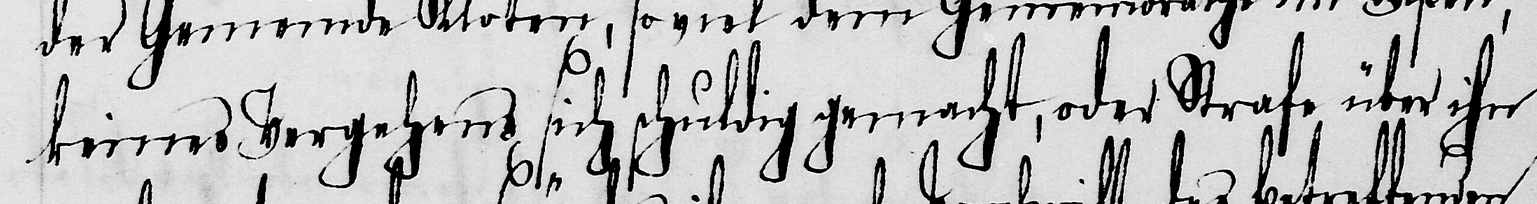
keines Vergehens sich schuldig gemacht, oder Strafe über ihn
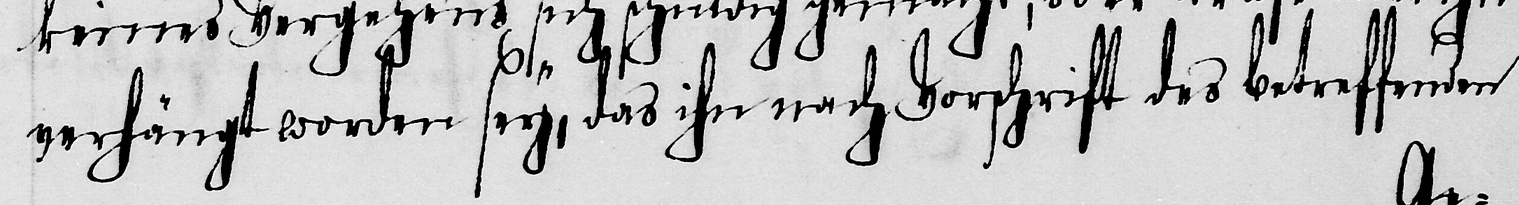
verhängt worden sey, das ihn nach Vorschrift des betreffenden
